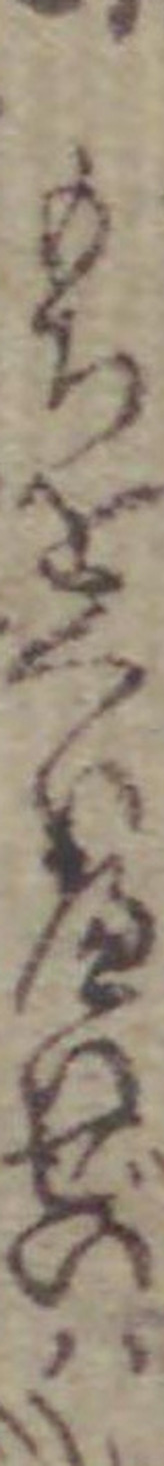もちをくいへいぜいは
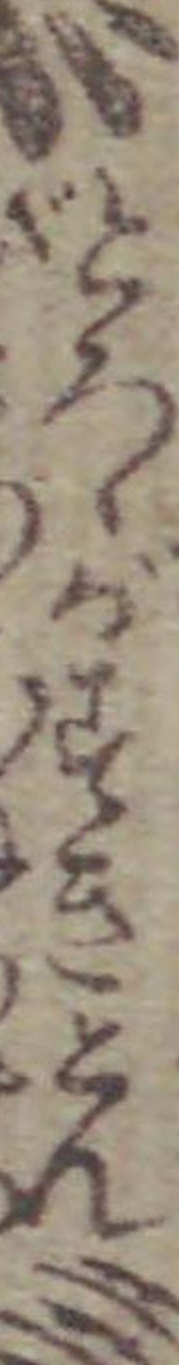とろゝがすきとん
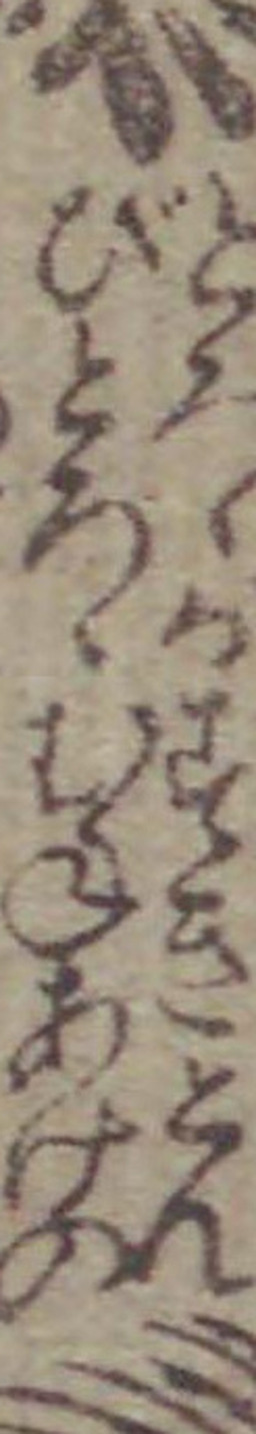びとろゝむねあけの
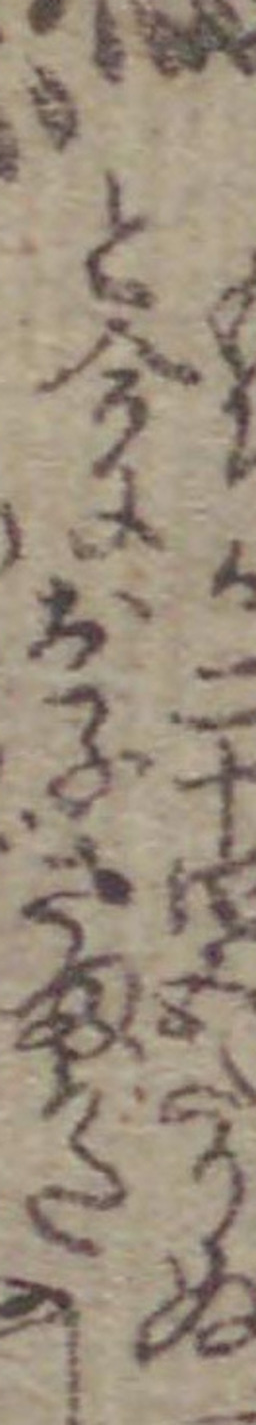と今にお子さまがた
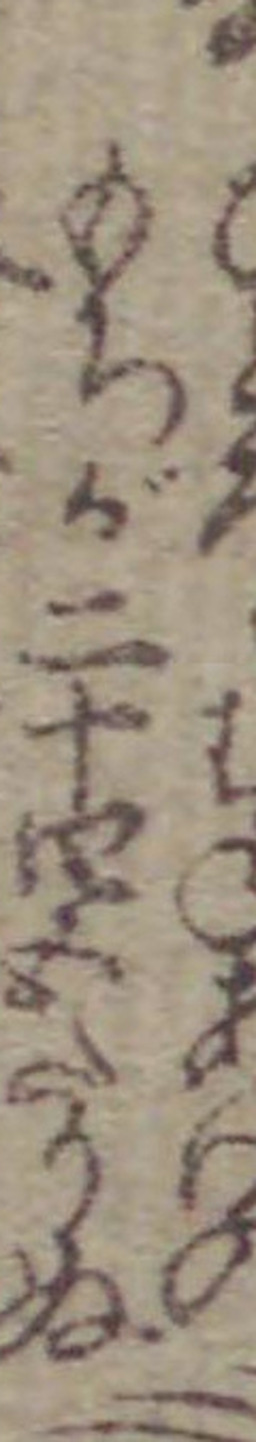もちが二十四五たりぬ
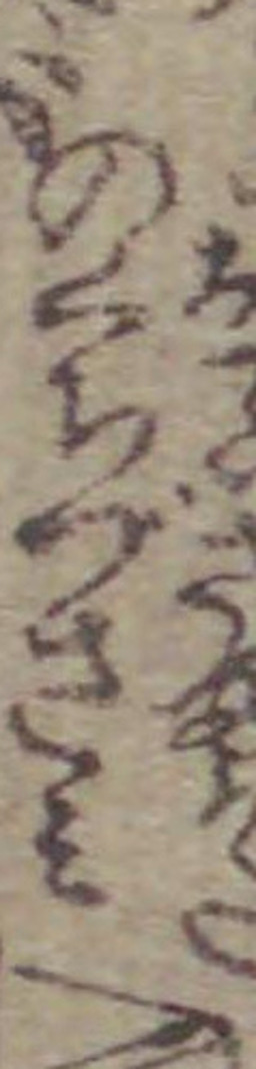のくちづさみ
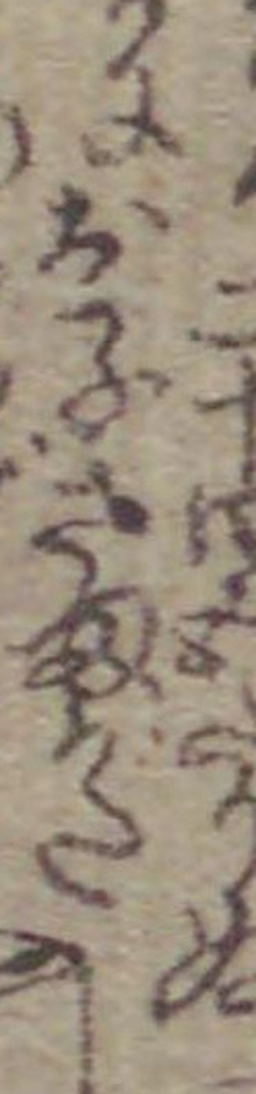と今にお子さまがた

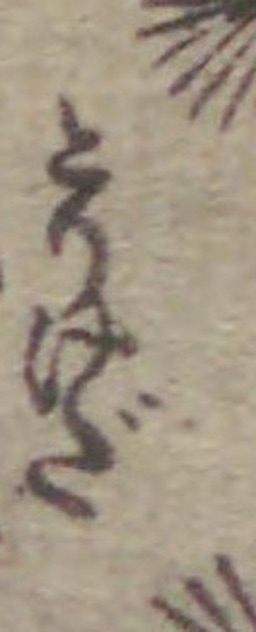とりけだ
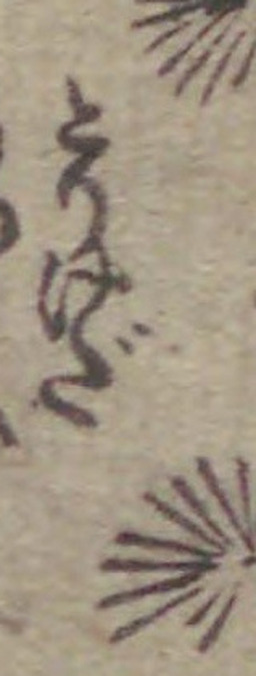とりけだ
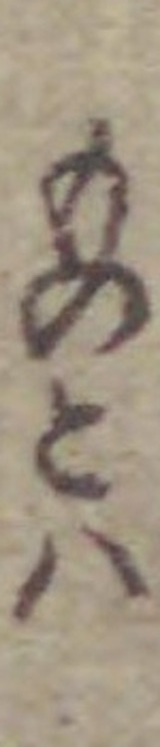ものとは
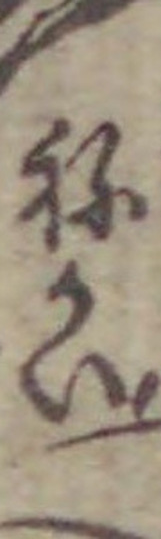ねかい
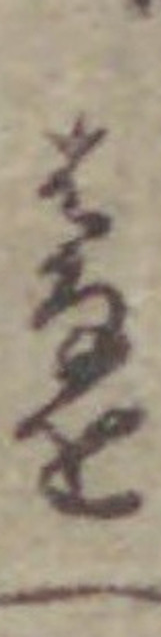はなを
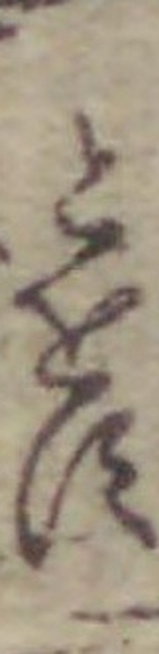とをす
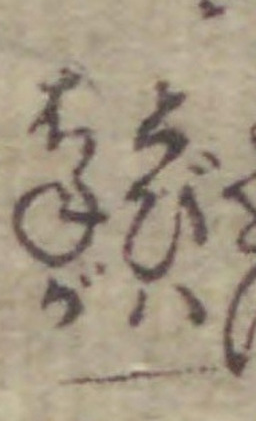はねが
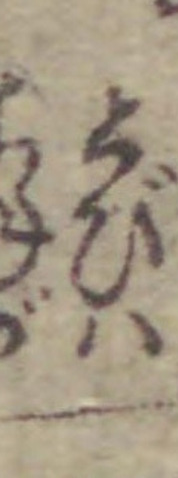とびは
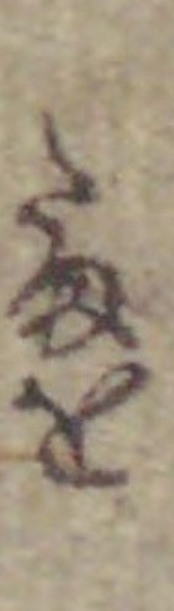たまを
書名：親父布子鳶握 3巻
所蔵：国立国会図書館 National Diet Library, JAPAN
